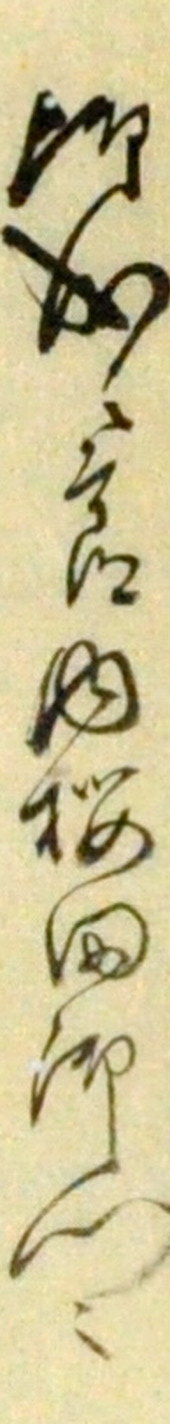御成之節内桜田御門之
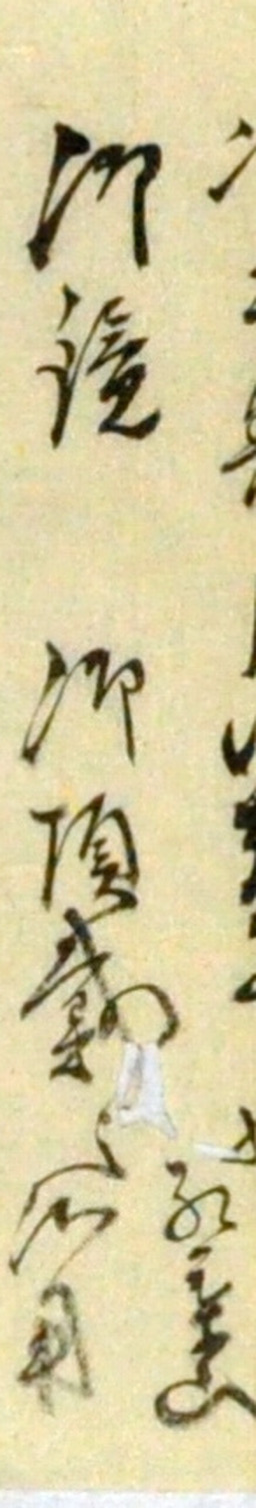御鏡御頂戴之御用
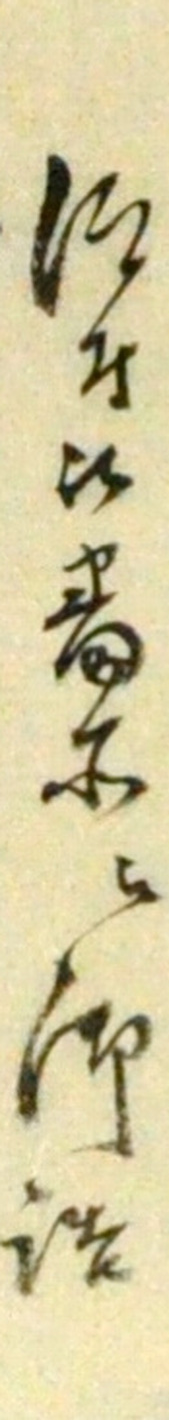被仰付御番所江御詰
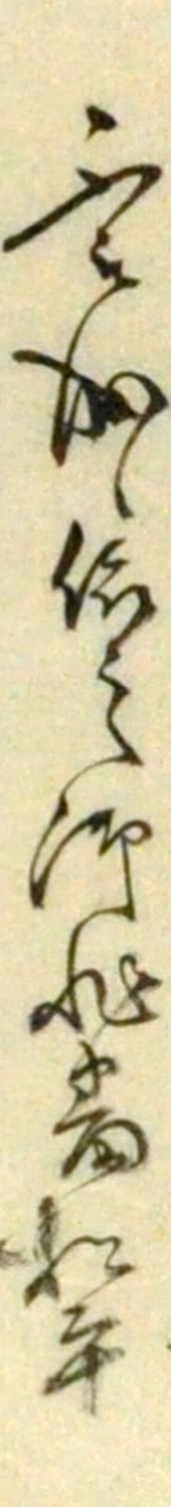不被成候依之御非番松平
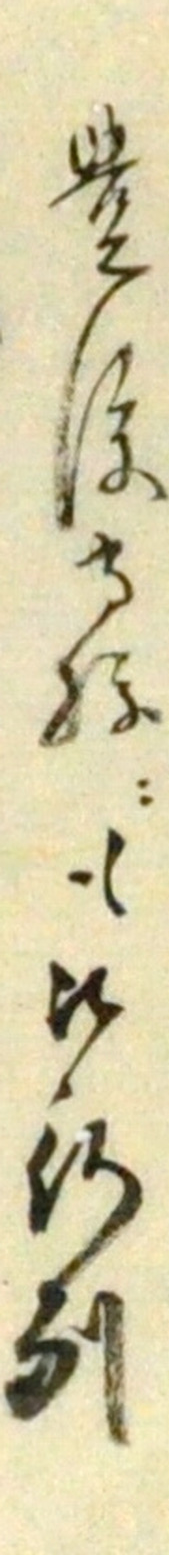豊後守様ニも御行列
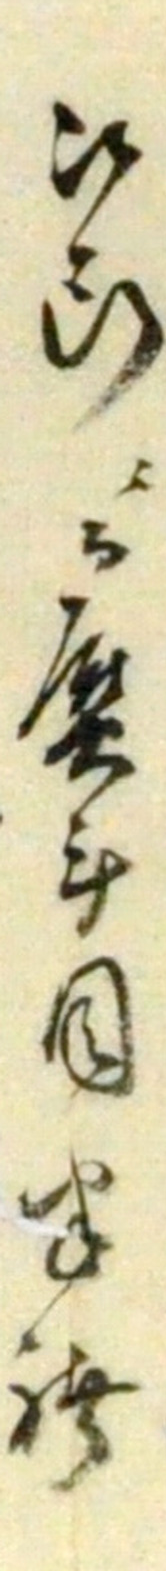御断ニ而熨斗目半袴
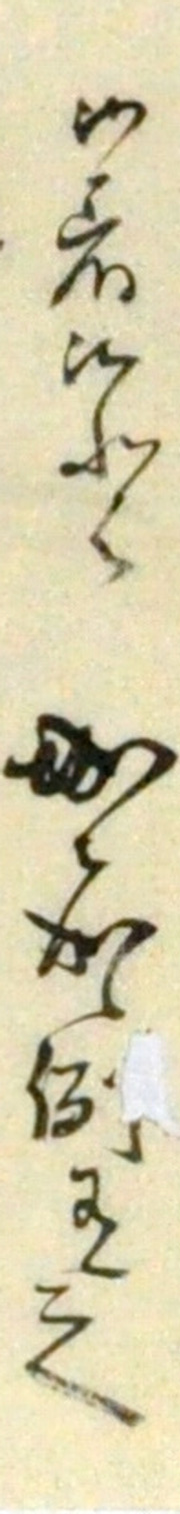御着御登城被成候例有之
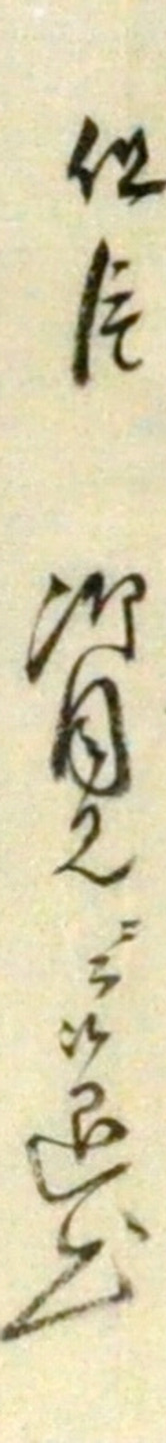但片御目見ニ而御退出
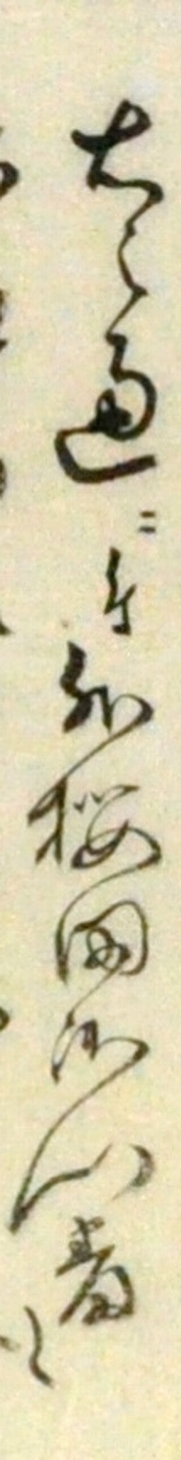右之通ニ付外桜田御門番も
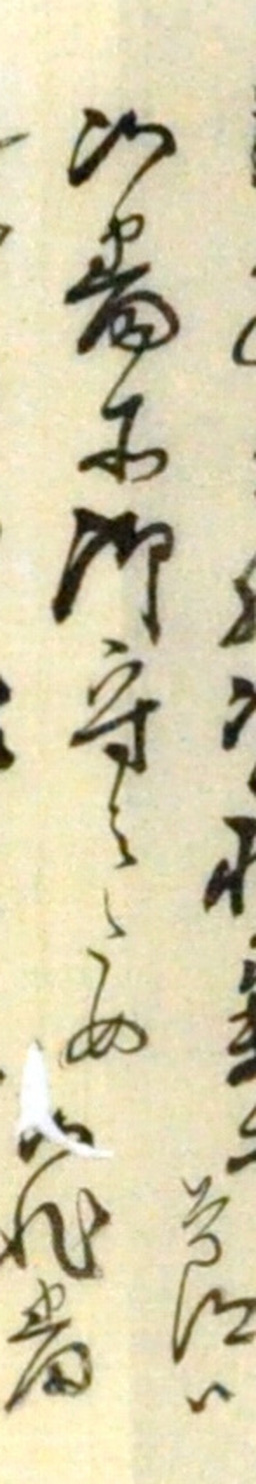御番所御守之ため御非番
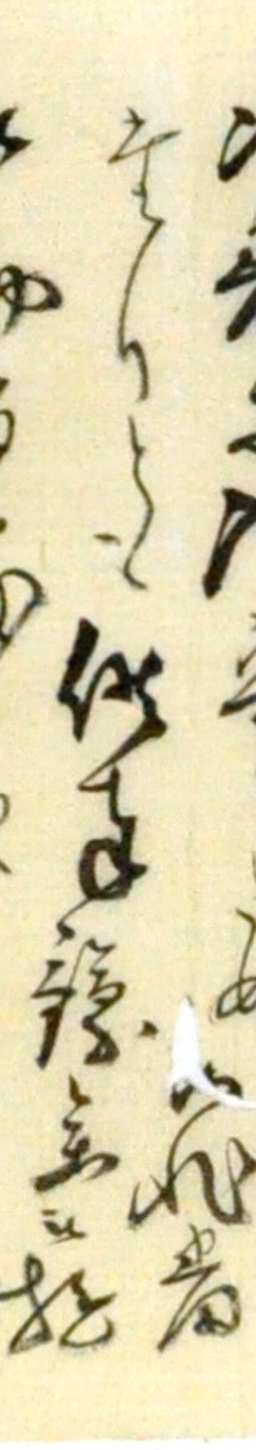たりとも供奉予参被遊
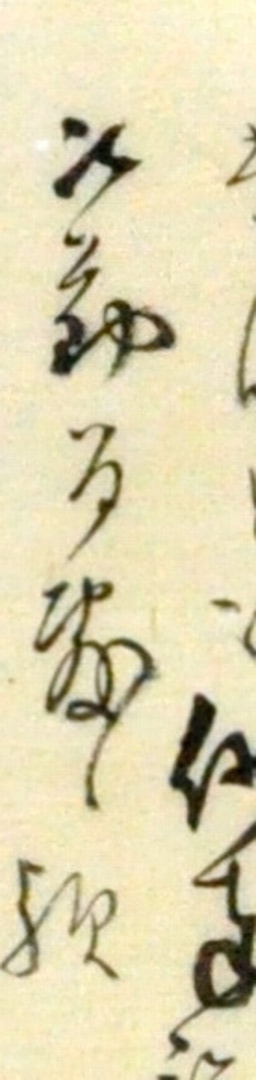御勤間敷候歟
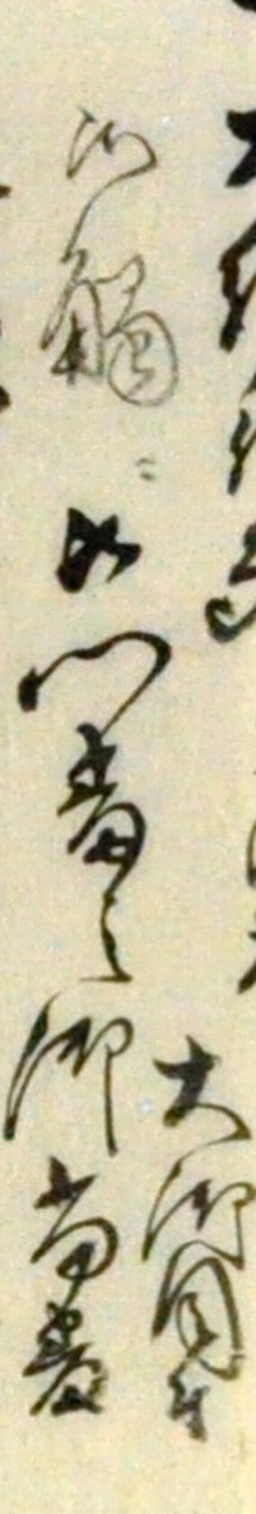御触ニ御門番之御当番
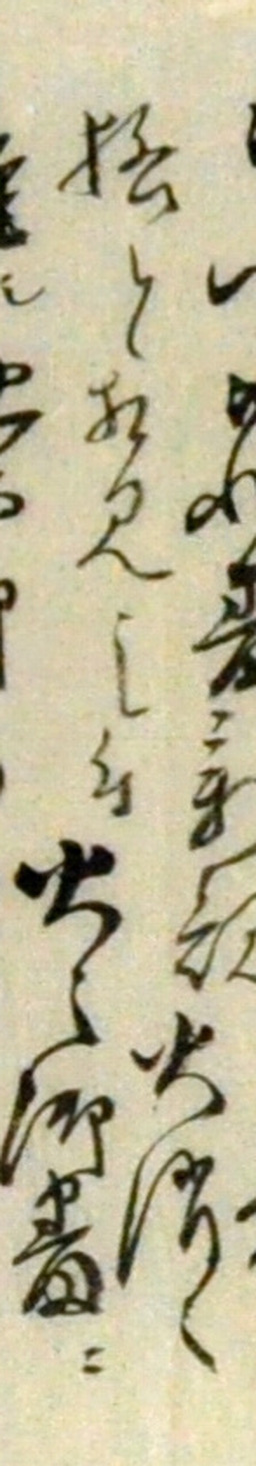格と相見申候付火之御番ニ
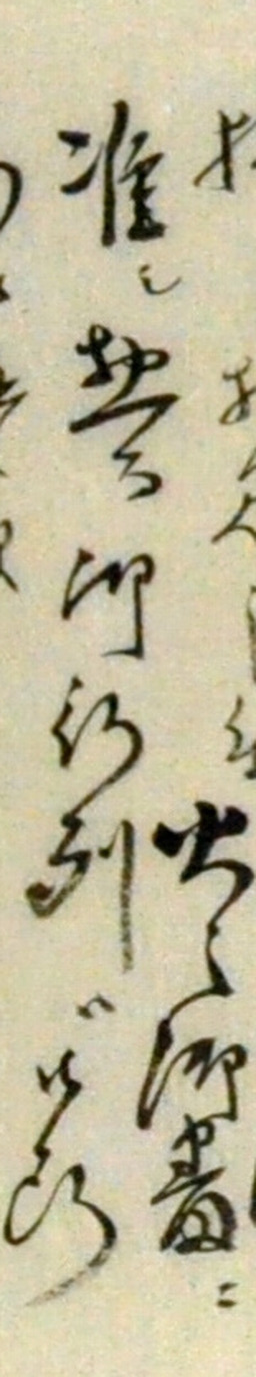准シ惣而御行列ハ御断
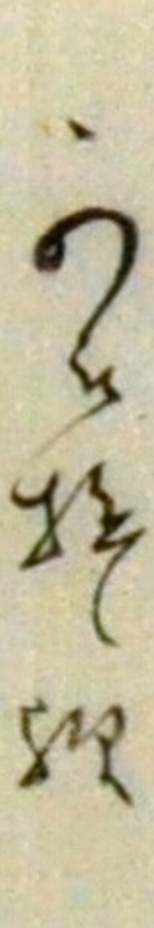可被遊候歟
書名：覚
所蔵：伊那市立高遠町図書館・合同会社AMANE
